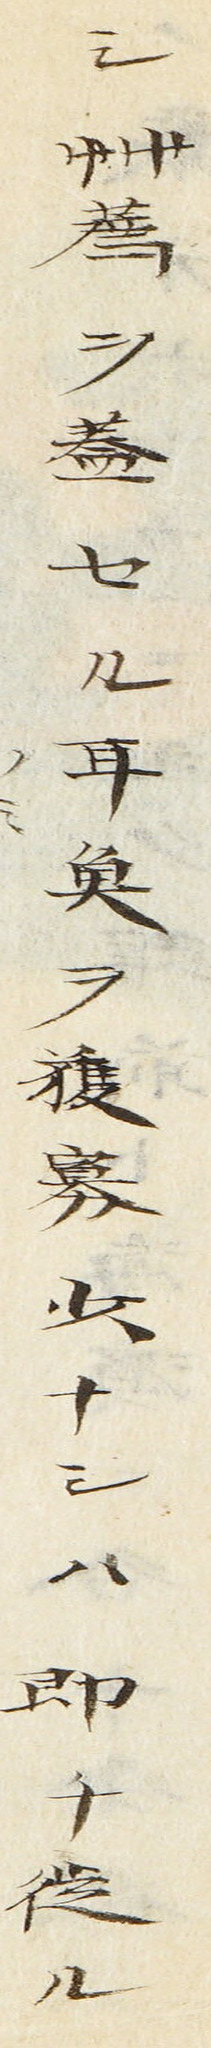シ艸薦ヲ蓋セル耳魚ヲ獲寡少ナシハ即チ徙ル
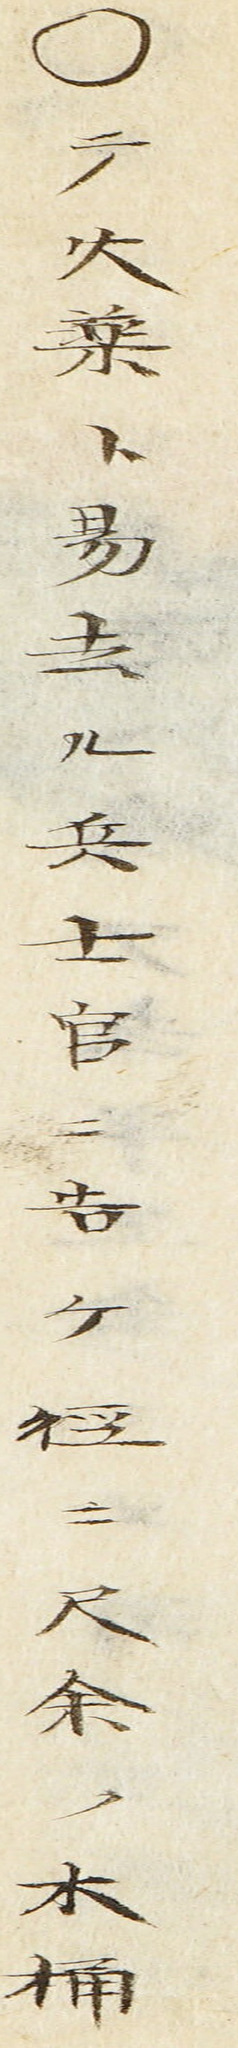〇テ火薬ト易去ル兵士官ニ告ケ径二尺余ノ木桶
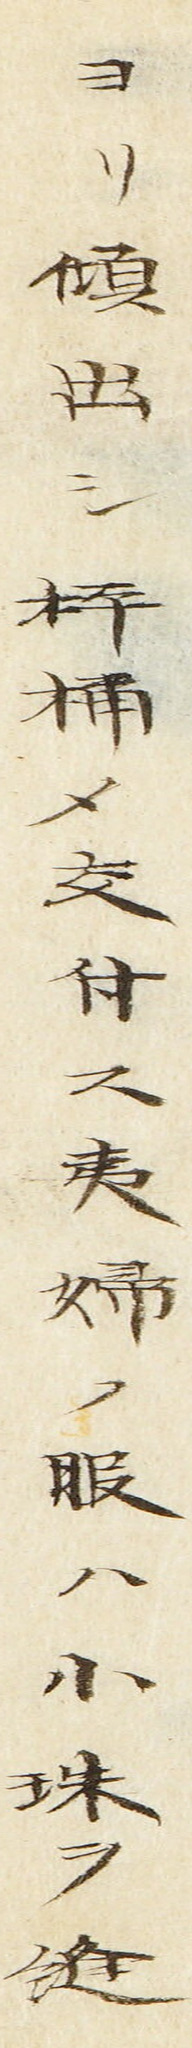ヨリ傾出シ枰桶シテ交付ス夷婦ノ服ハ小珠ヲ縫

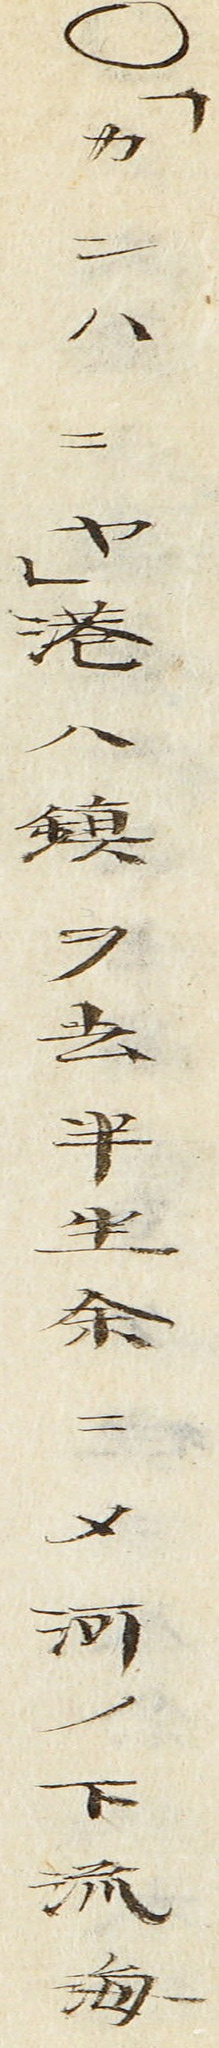〇「カンハニヤ」港ハ鎮ヲ去半里余ニシテ河ノ下流海
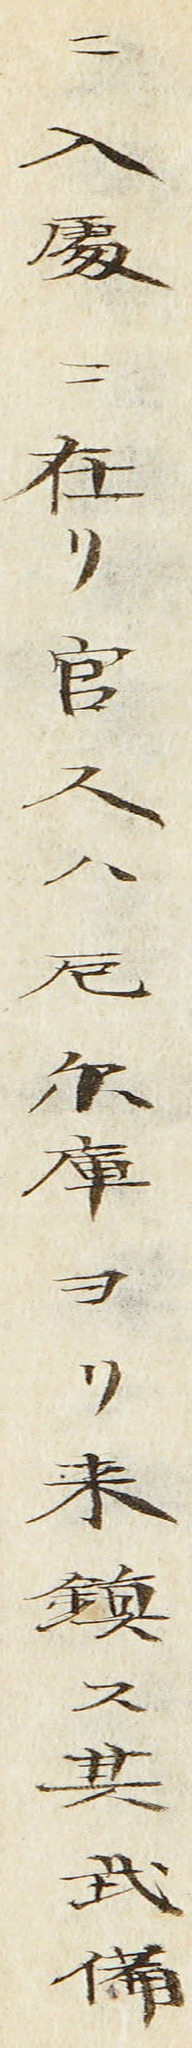ニ入處ニ在リ官人ハ厄尓庫ヨリ来鎮其武備
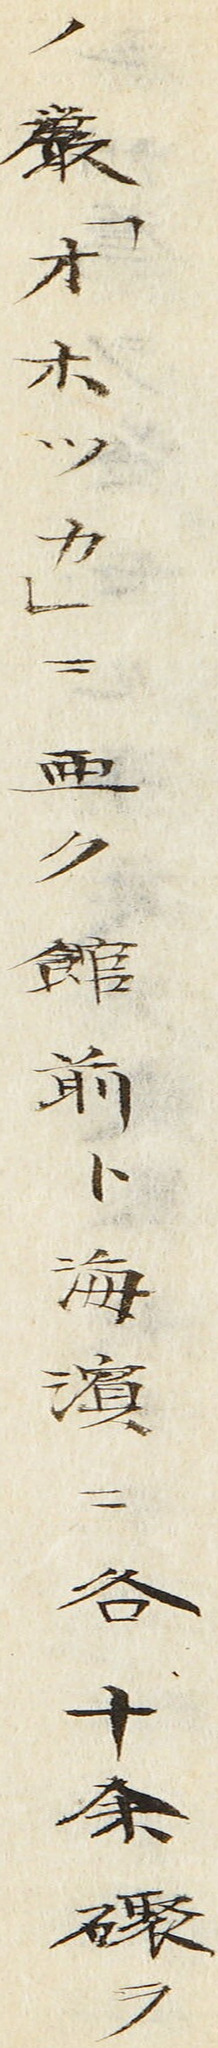ノ厳「オホツカ」ニ亜ク館前ト海濱ニ各十余ヲ
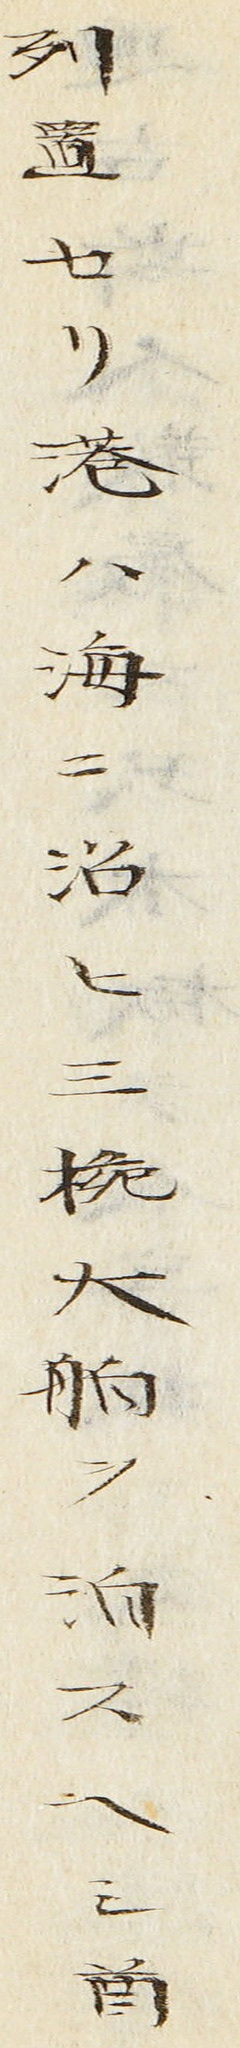列置セリ港ハ海ニ沿ヒ三桅大舶ヲ泊スヘシ酋
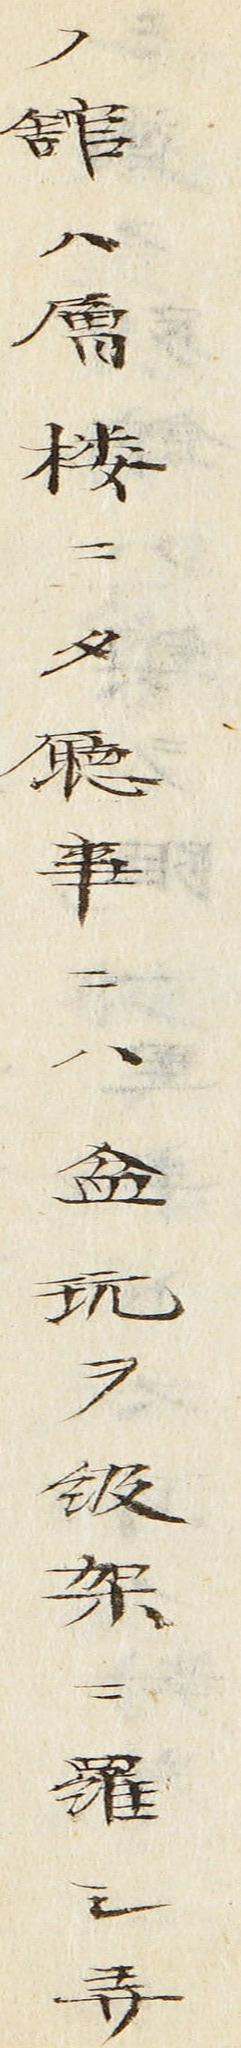ノ館ハ層楼ニ夕廰事ニハ盆玩ヲ級架ニ羅シ弄
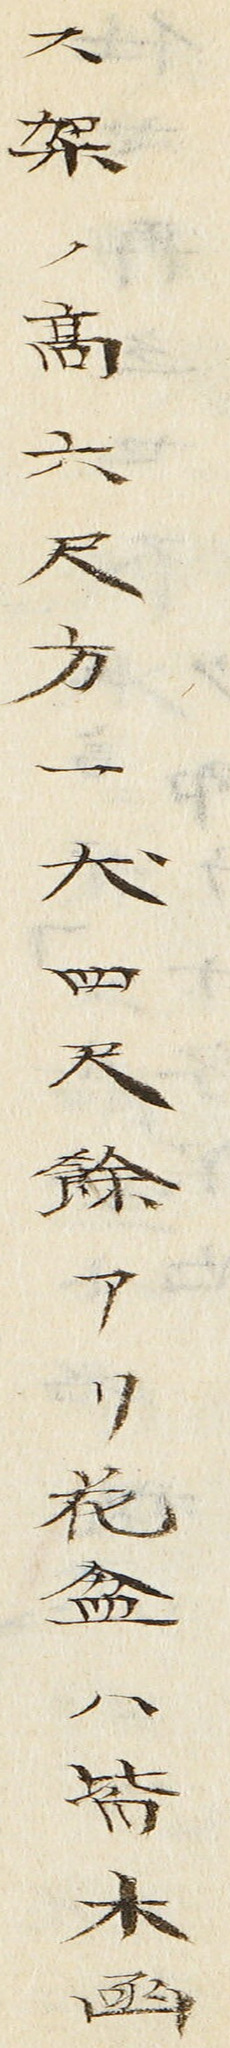ス架ノ高六尺方一丈四尺餘アリ花盆ハ皆木函
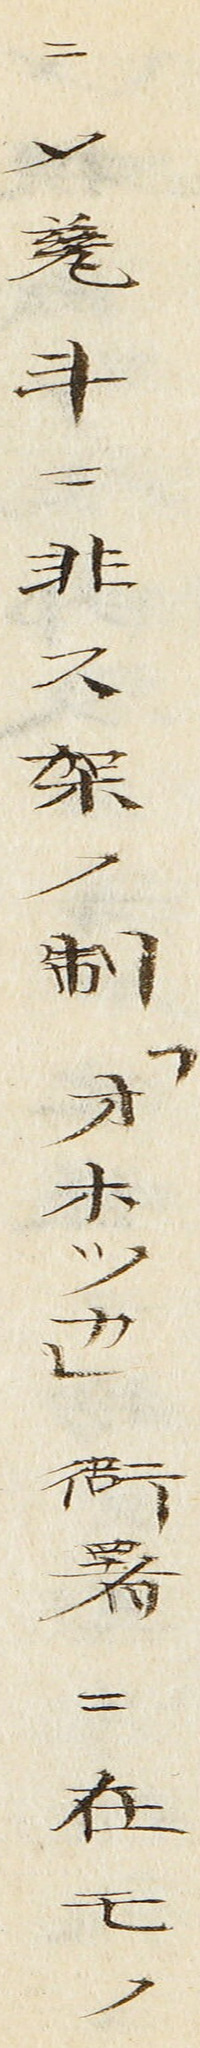ニシテ甆斗ニ非ス架ノ制「オホツカ」衙署ニ在モノ
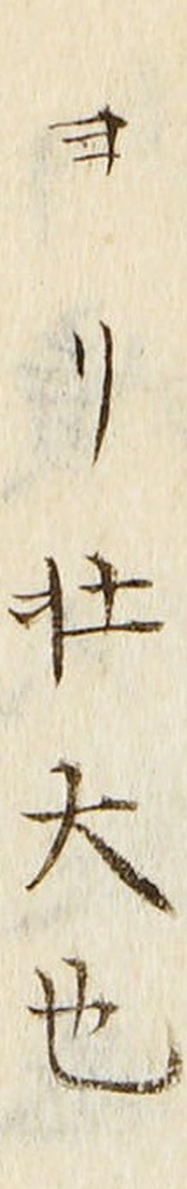ヨリ壮大也
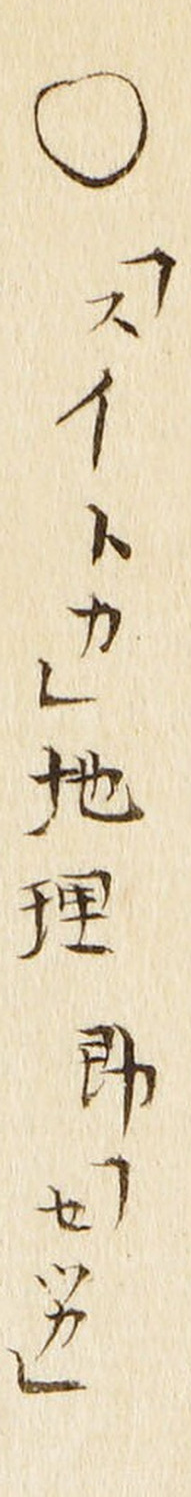〇「スイトカ」地理即「セツカ」
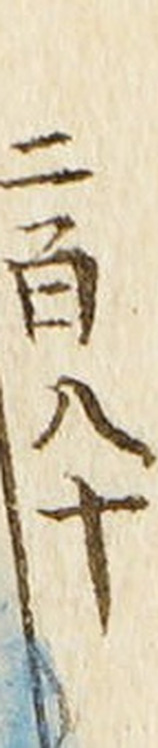二百六十
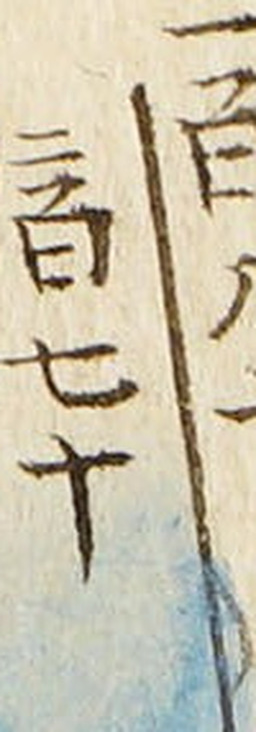二百六十
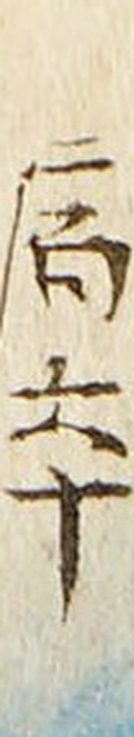二百六十
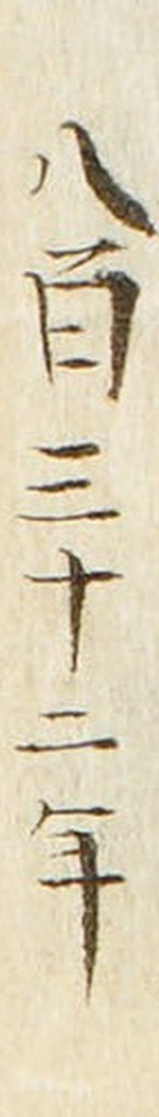八百三十二年
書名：蕃談
